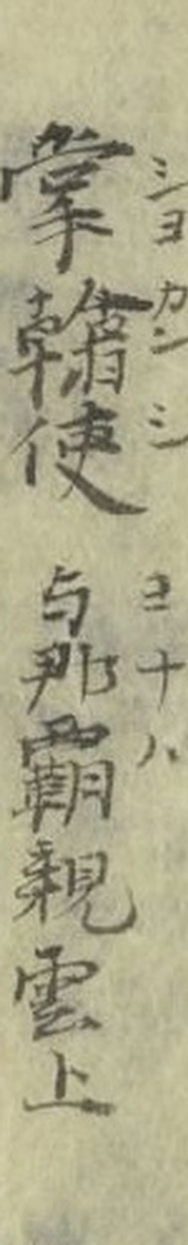掌翰使与那覇親雲上
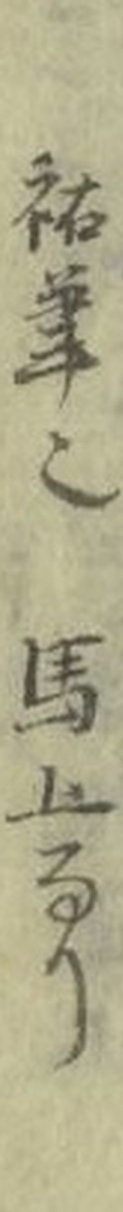祐筆也馬上なり

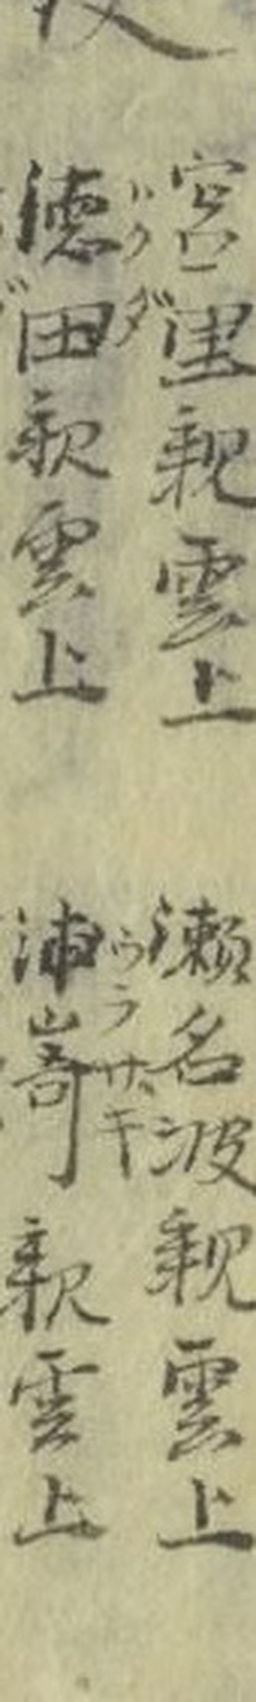徳田親雲上浦嵜親雲上
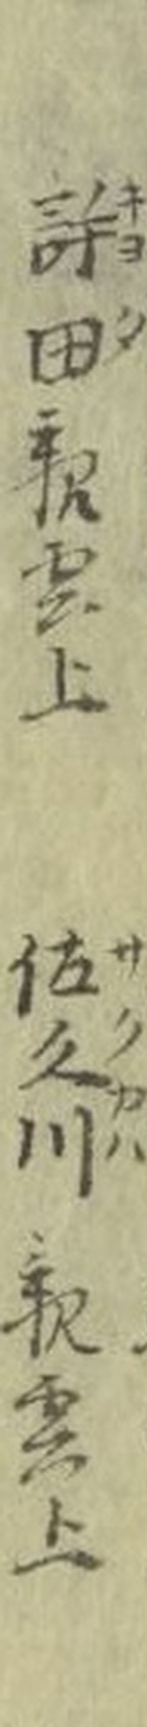許田親雲上佐久川親雲上
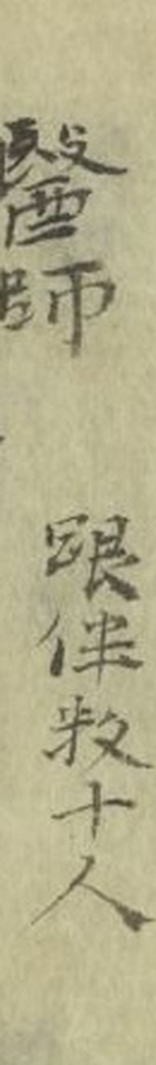医師跟伴数十人
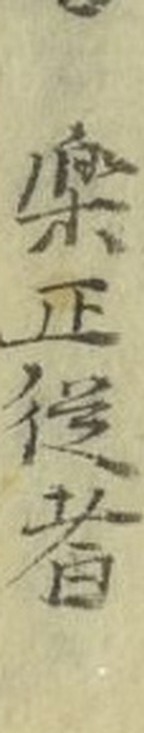楽正従者
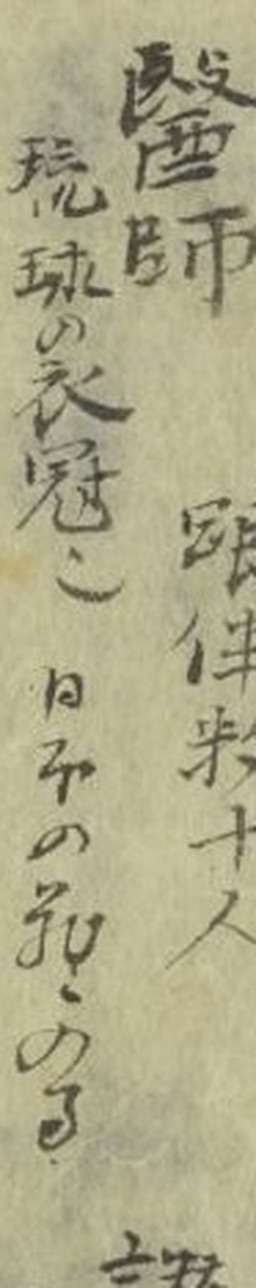琉球の衣冠也日本の籠にのる
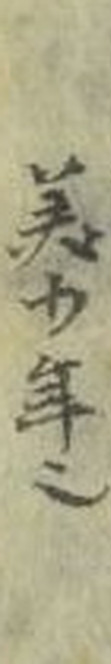美少年也
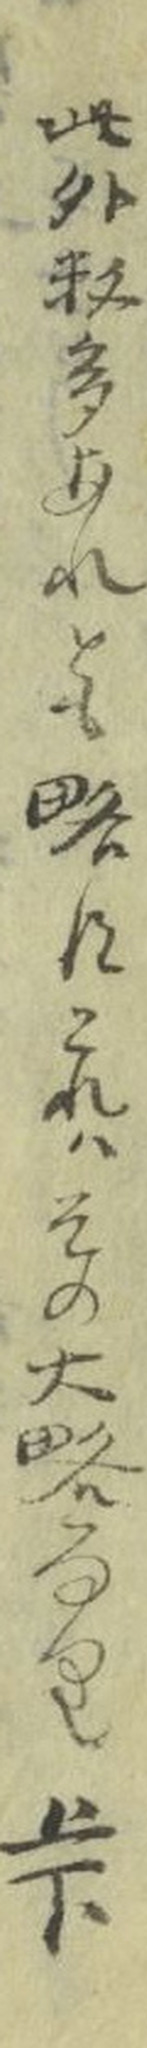此外数多あれとも略すこれはその大略なり上下
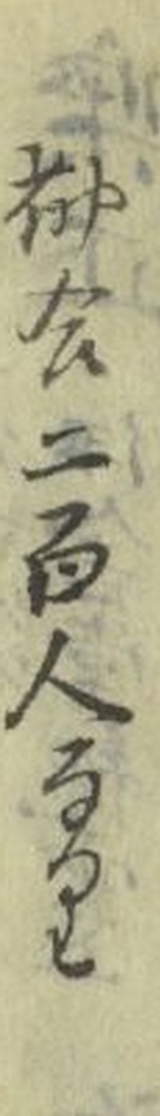都合二百人なり
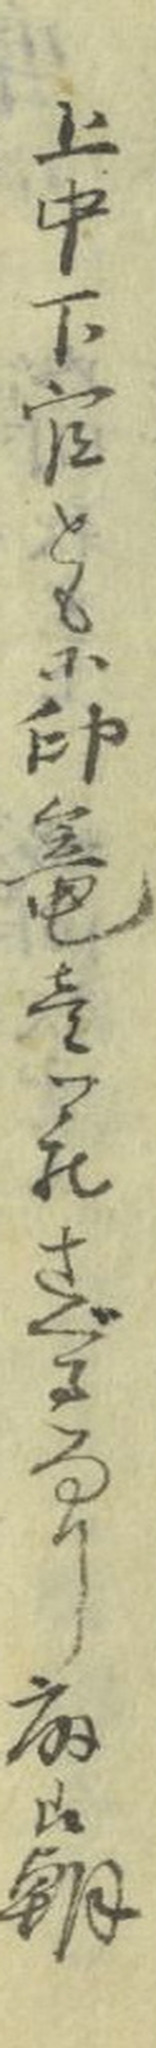上中下官ともに印篭もさべるなり朝
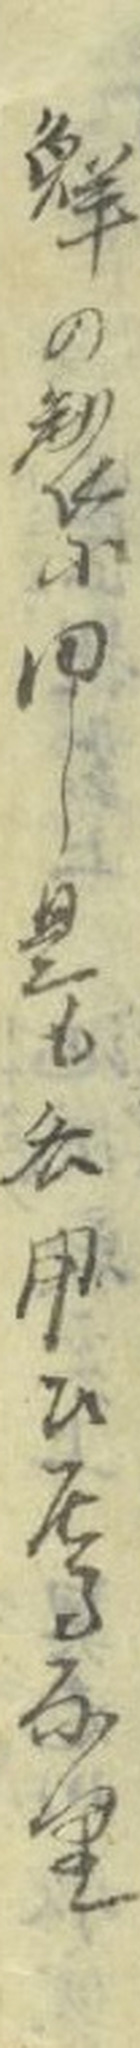鮮の製に同し是も用ひたるなり
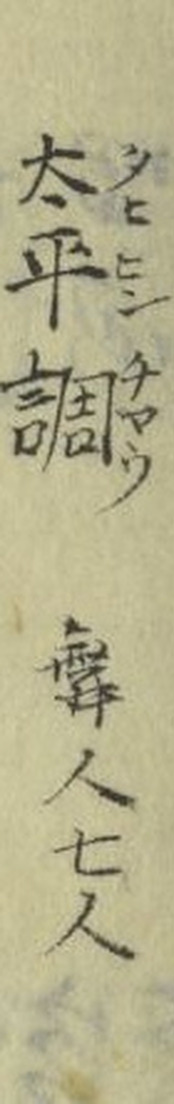太平調舞人七人
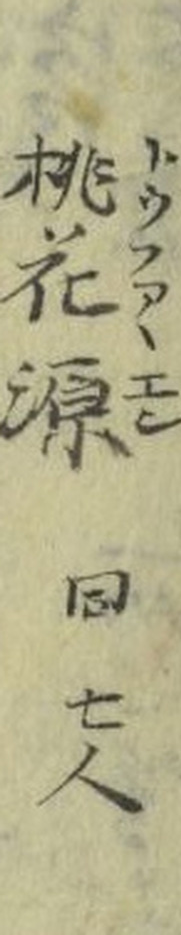桃花源同七人
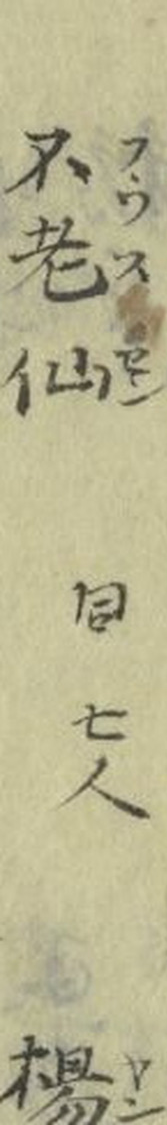不老仙同七人
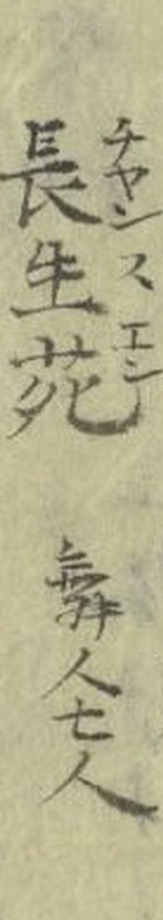長生苑舞人七人
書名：天保三年来朝 琉球人行列記
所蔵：University of the Ryukyus Library
